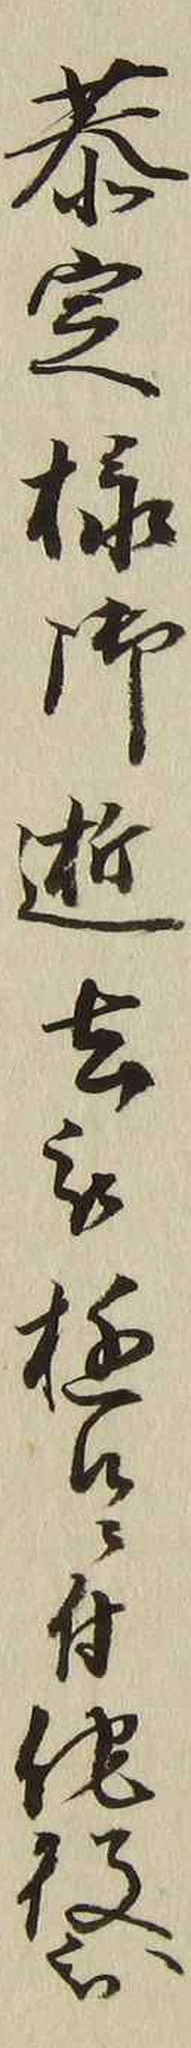恭定様御逝去被遊候ニ付他役被
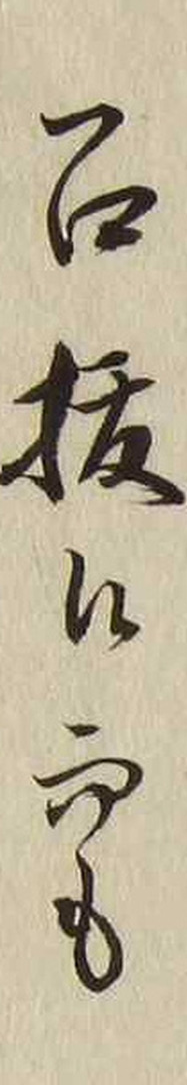召抜候而も
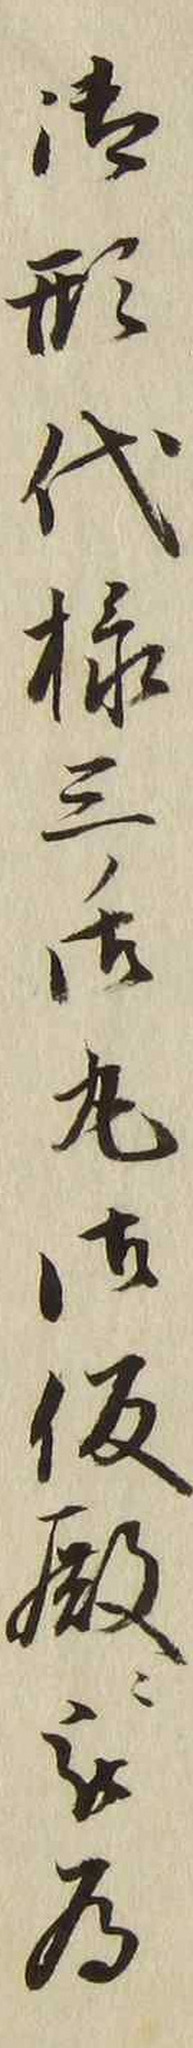御形代様三ノ御丸御仮殿ニ被為

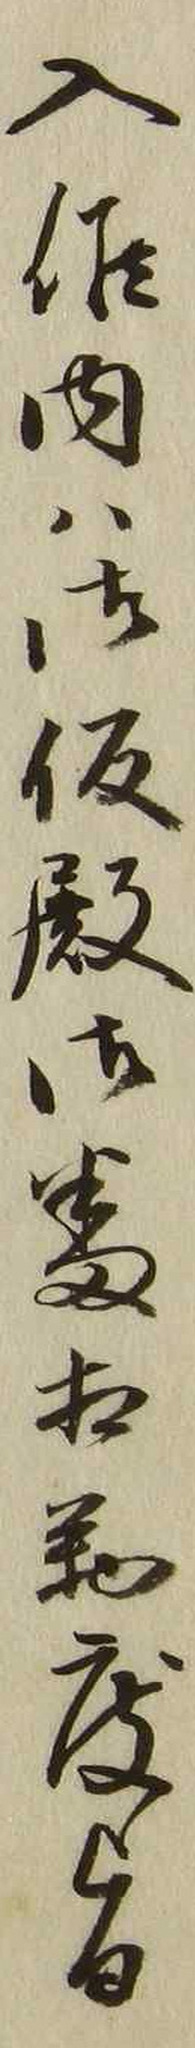入候内ハ御仮殿御番相勤度旨
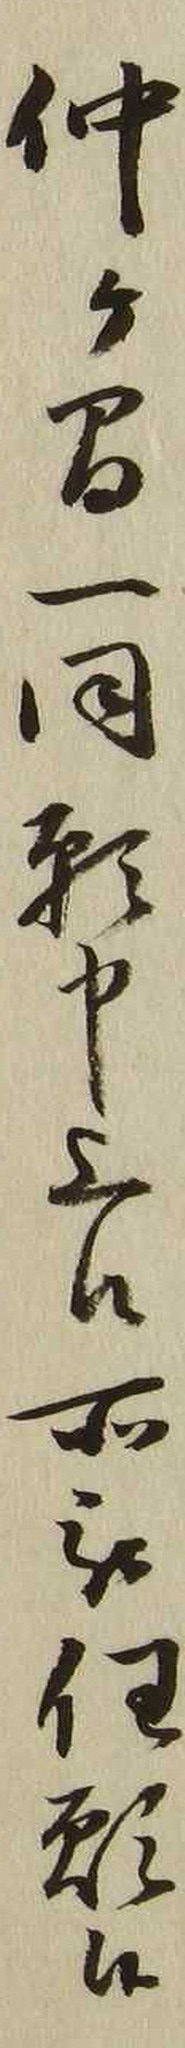仲ヶ間一同願申上候所被任願候
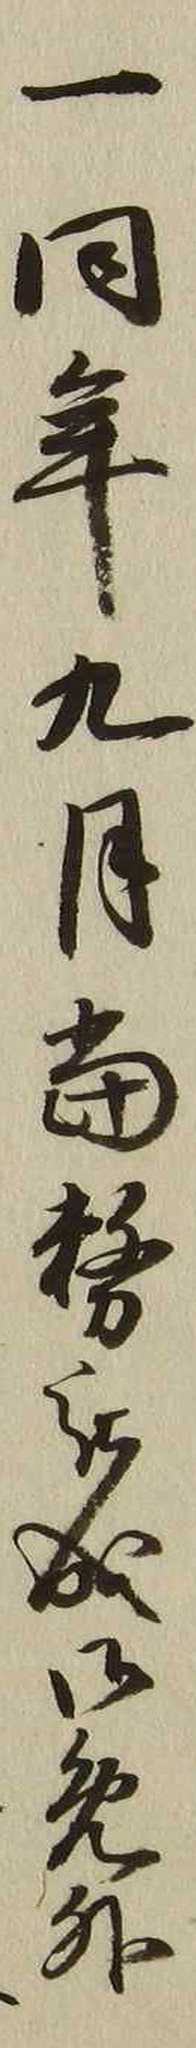一同年九月当務被成御免外
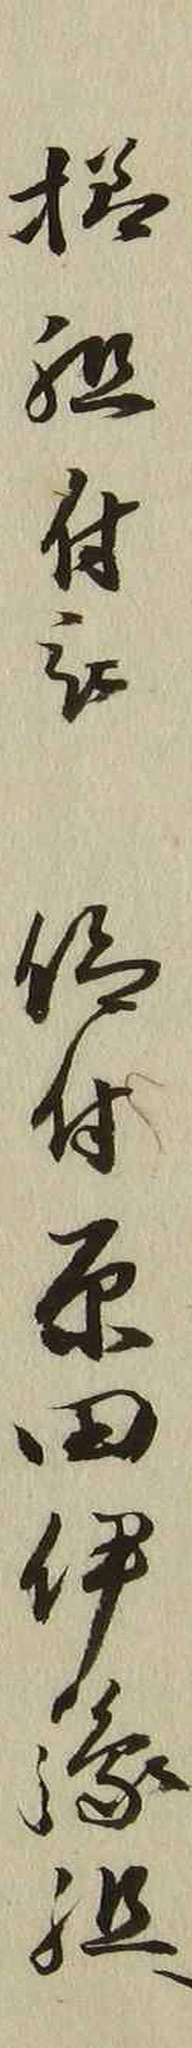様組付被仰付原田伊予組へ
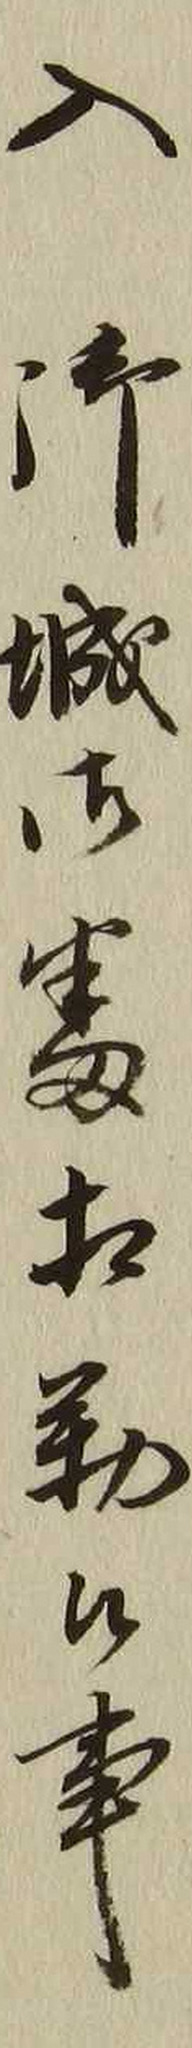入御城御番相勤候事
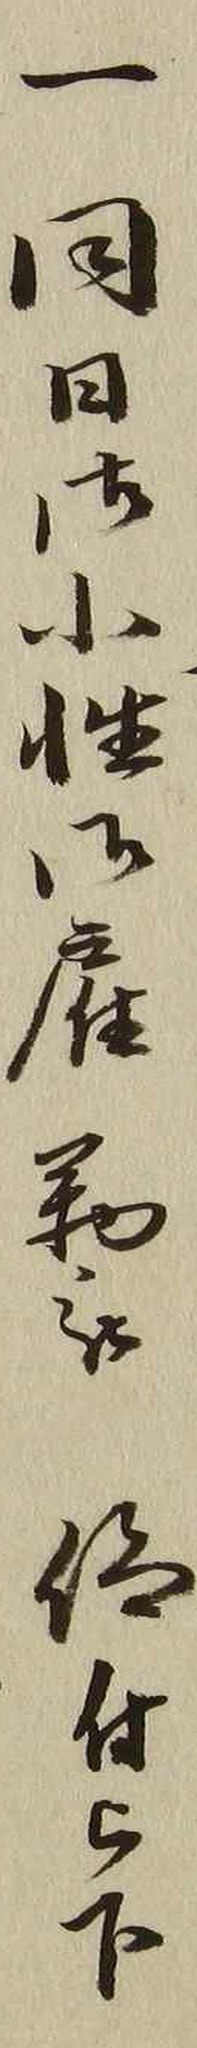一同日御小性御雇勤被仰付被下
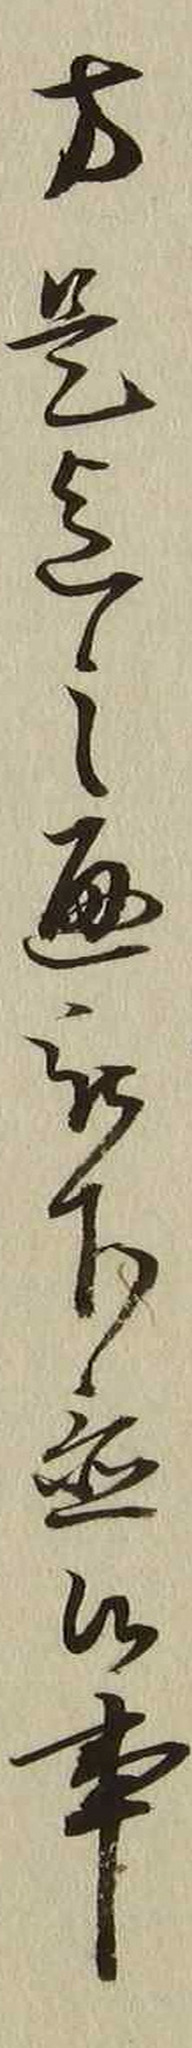方是迄之通被下置候事
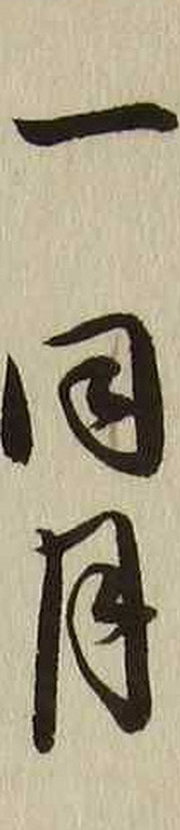一同月
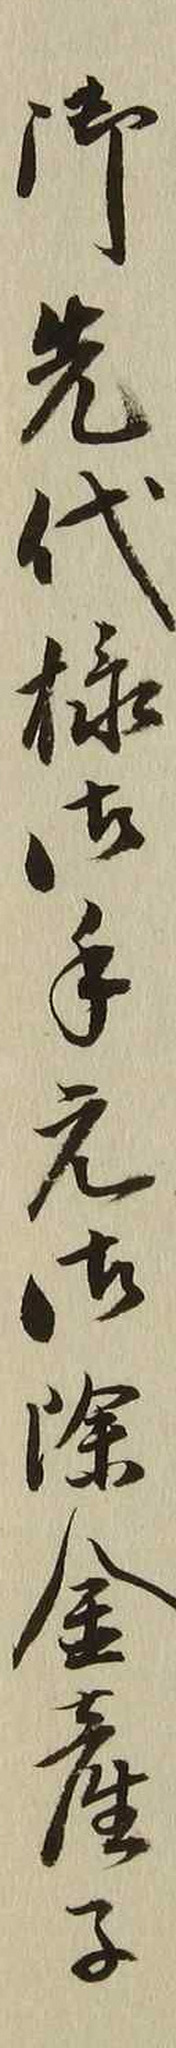御先代様御手元御除金産子
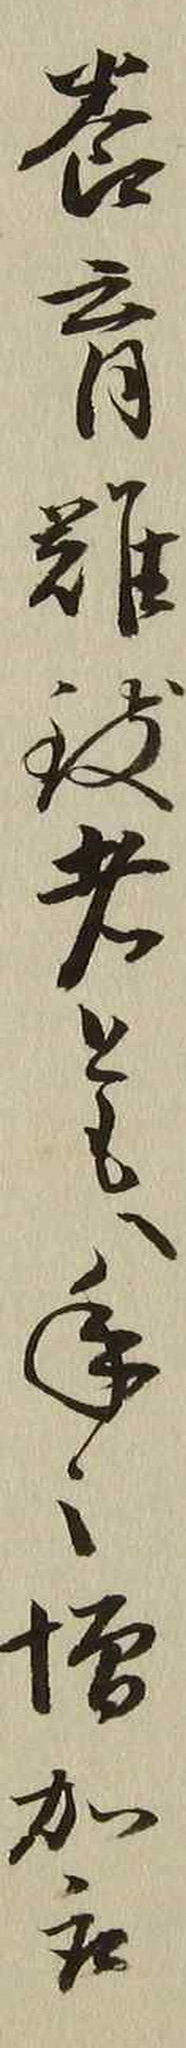養育難致者ともへ年之増加取
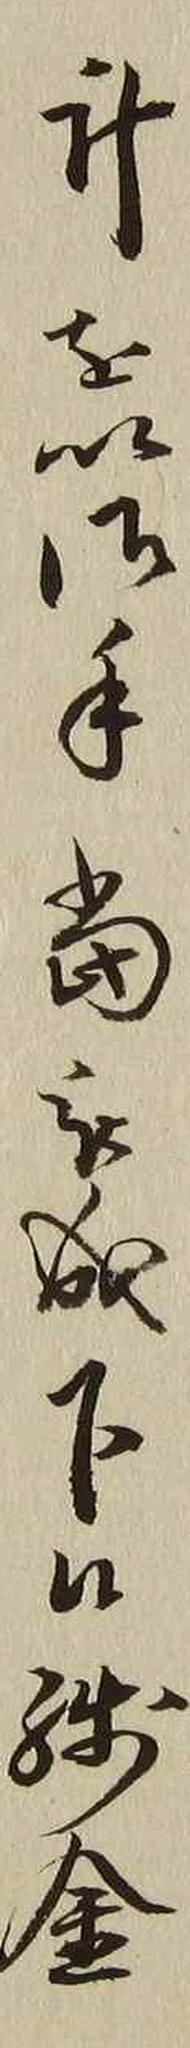計を以御手当被成下候残金
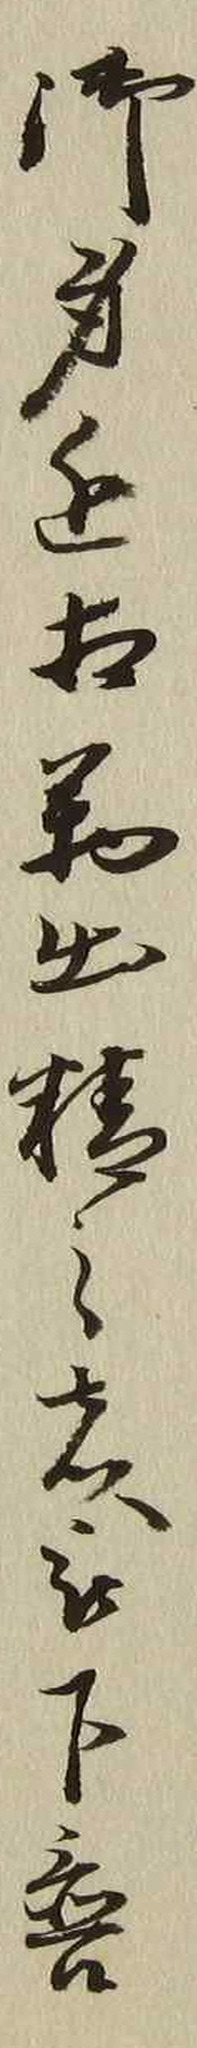御身近相勤出精之者ハ被下置候
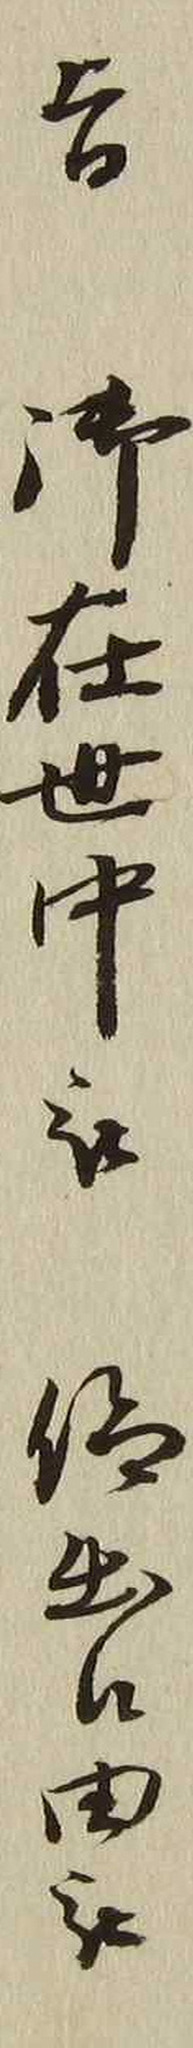旨御在世中被仰出候由被
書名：諸士系譜　巻之61　と之部4
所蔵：会津若松市立会津図書館
